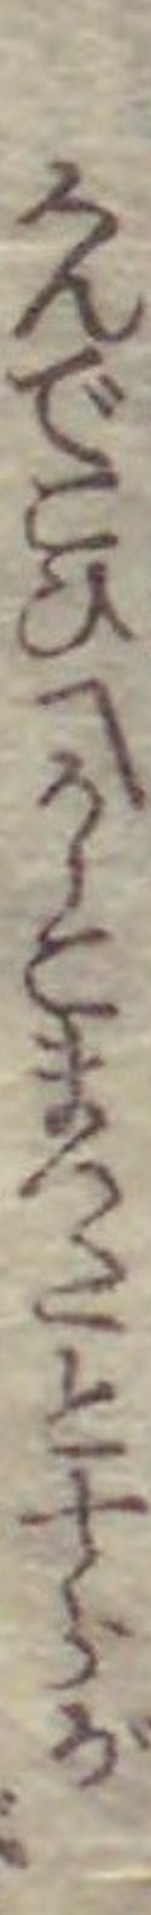くんでこひ〽かしこまつたと十郎が
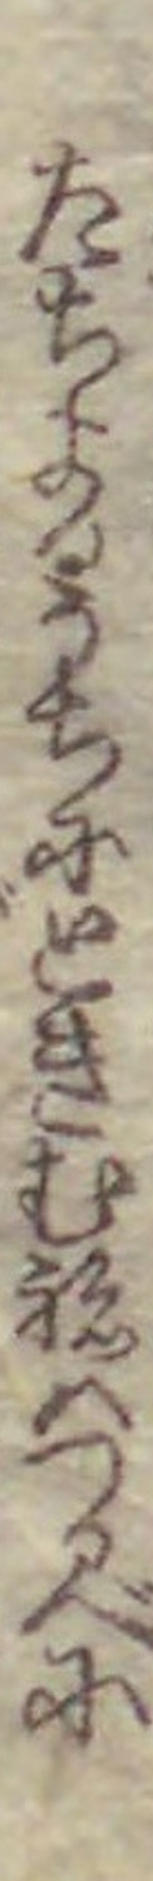たちよるうちにときむねはつるべに
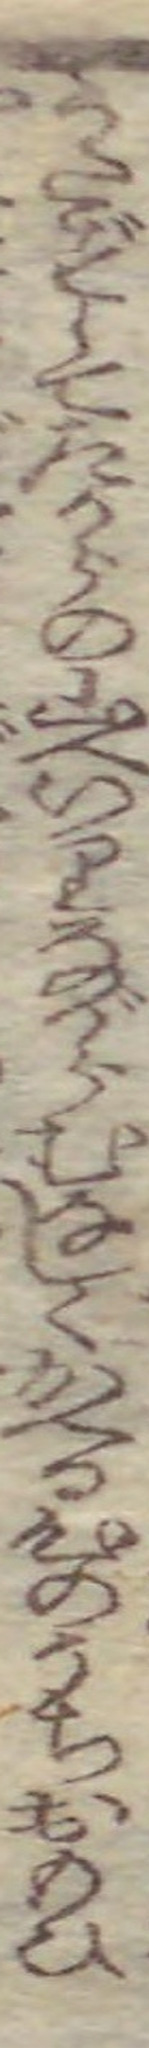うたずしてたからの山へいりながらむなしくかへる心のうちおもひ
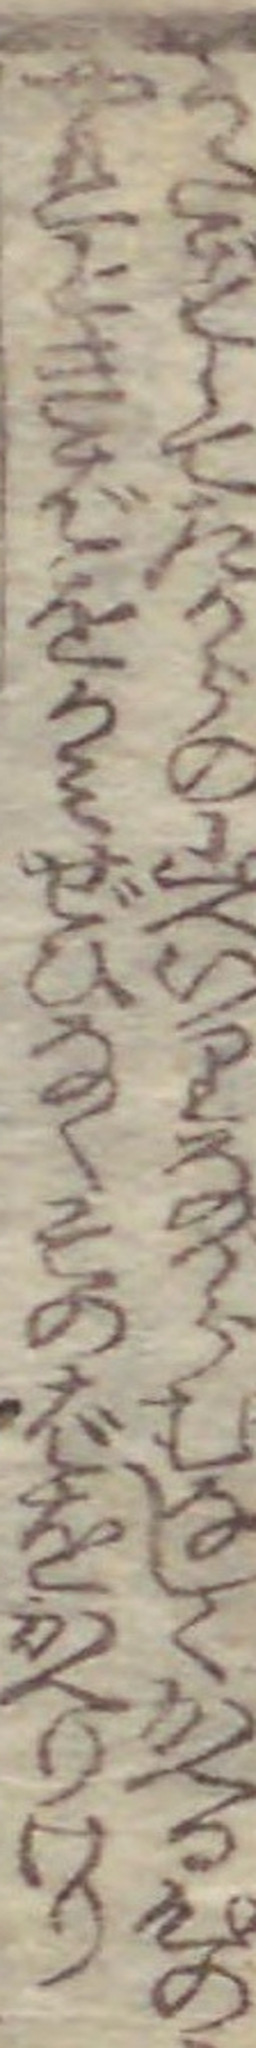やれときばをかみぜひなくそのばをかへりけり
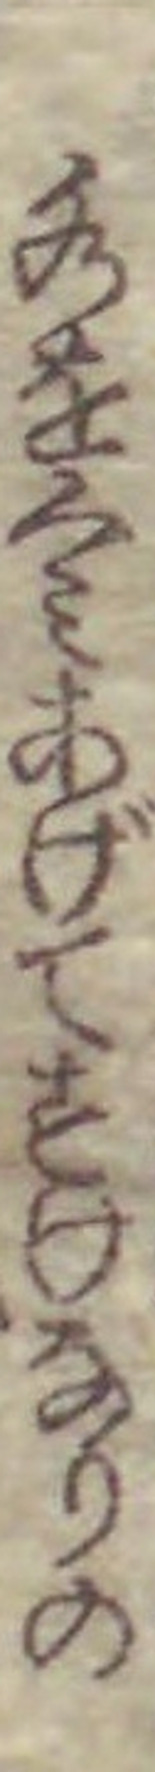水をくみあげてすけなりの
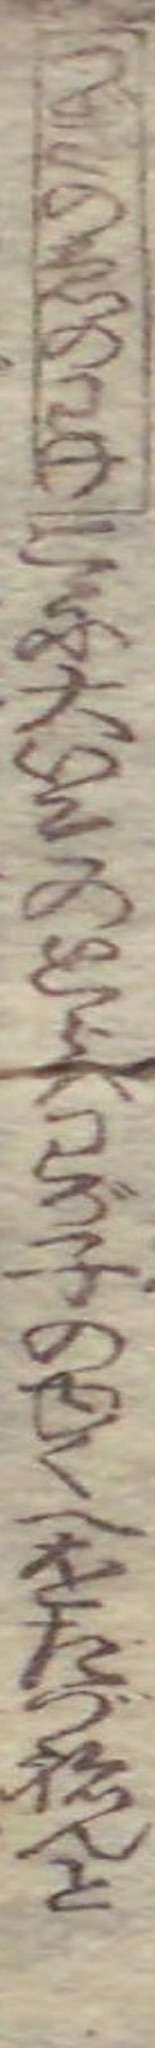つぎのゑのわけこゝに大いそのとらはわが子のゆくへをたづねんと
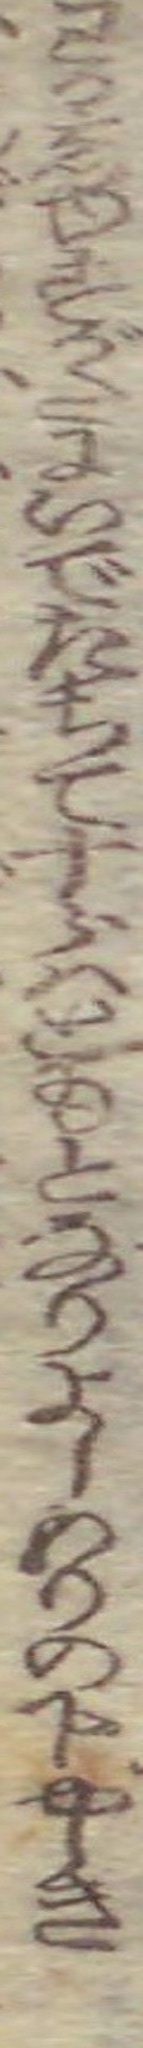わかしゆすがたにいでたちて十郎はともとなりよしもりの下やしき
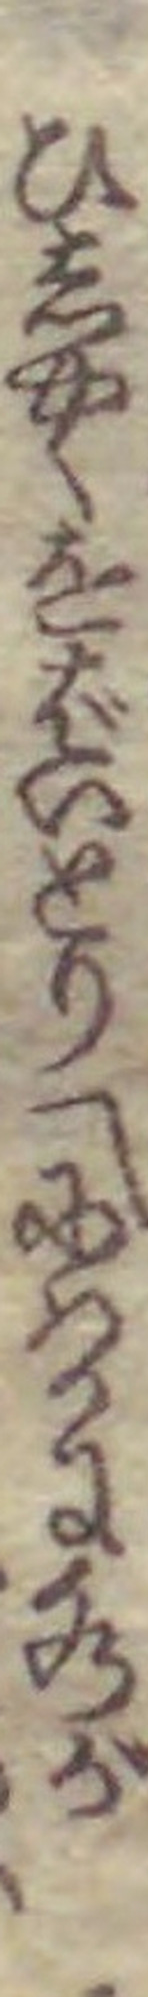ひしやくをばいとり〽にはかに水が
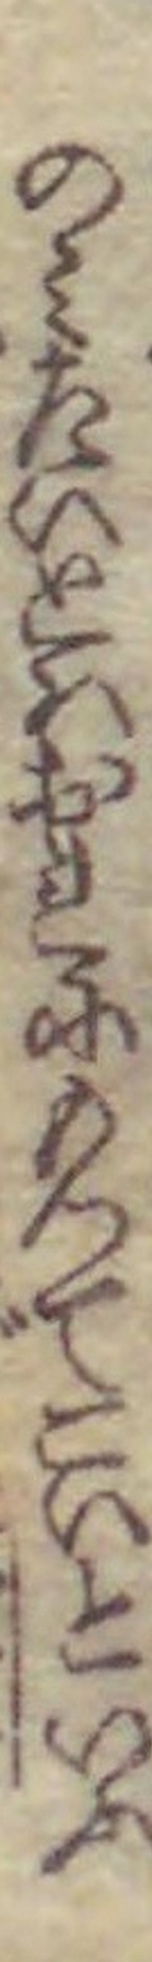のみたいとはおれにもつてこいといふ
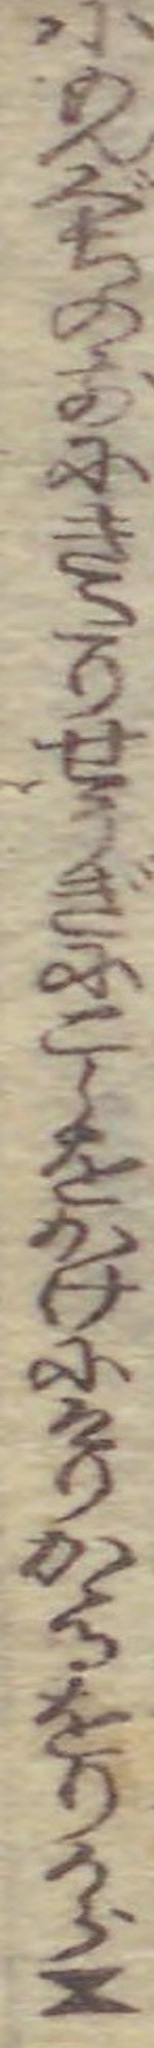小もんぐちの前にきたりせうぎにこしをかけにはりかゝるをりから▼▲
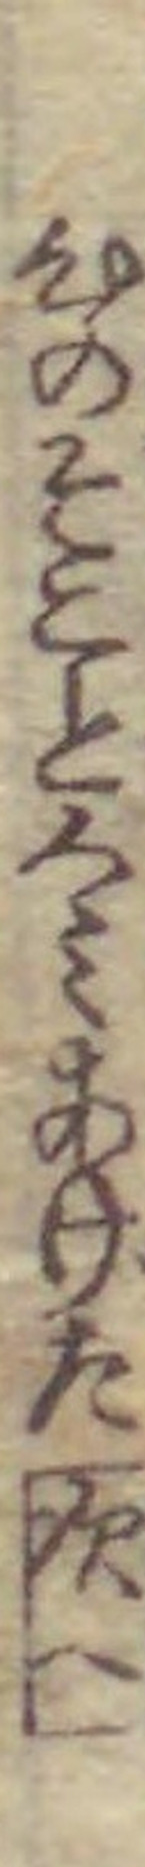心のそことくみあげた次へ

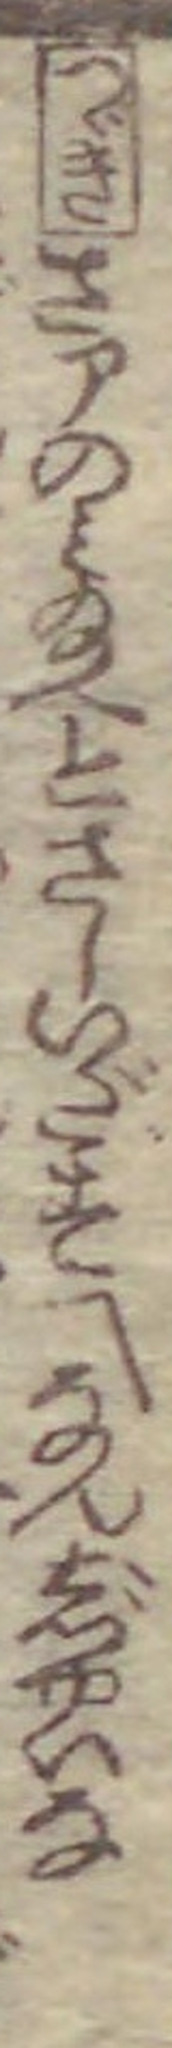つづきさアのみ給へとさしいだす〽なんじやいな
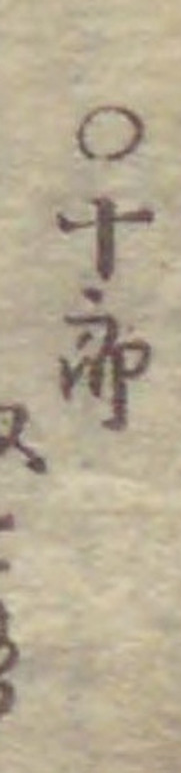○十郎
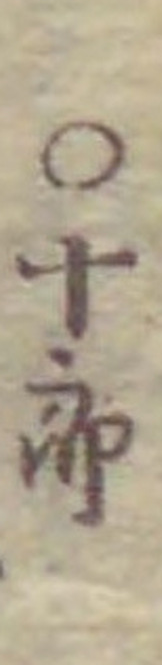○十郎
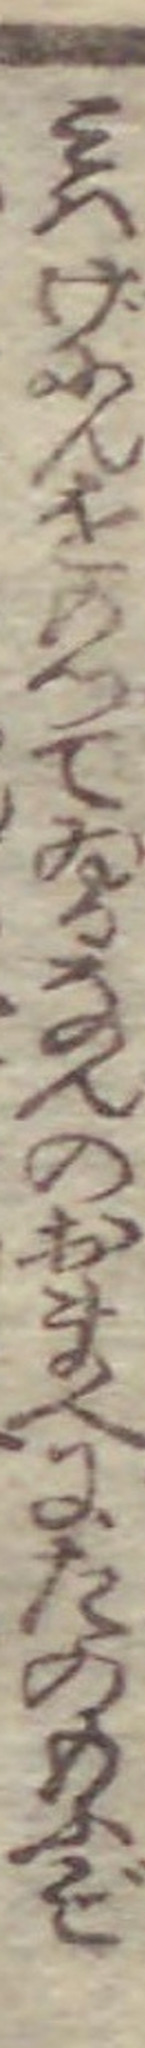みはげにんをもつてゐるなんのおまへにたのもふぞ
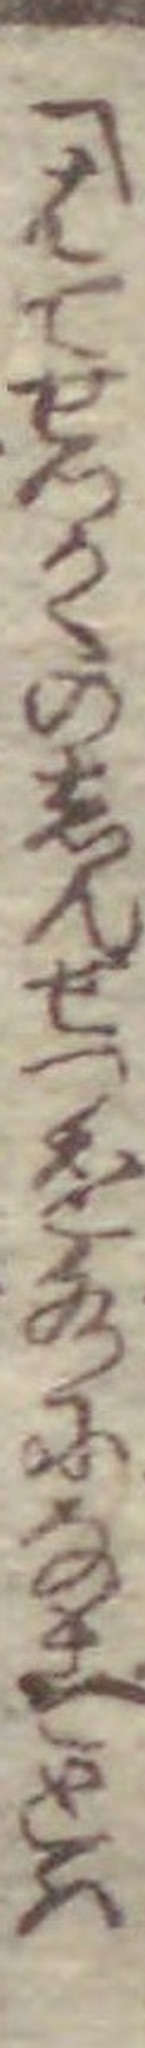〽はてせつかくのしんせつを水になすとは
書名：大時代唐土化物 3巻. 曽我太夫染
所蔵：国立国会図書館 National Diet Library, JAPAN
